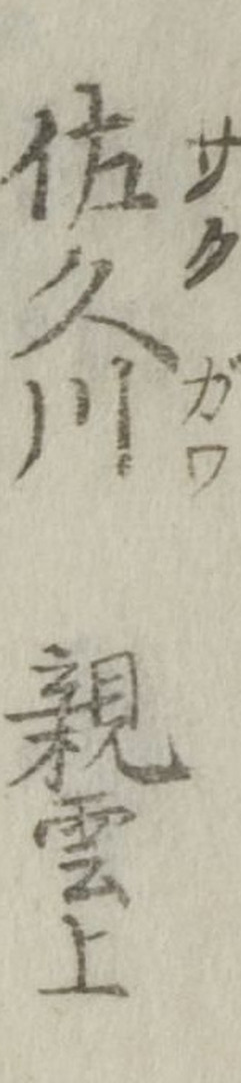佐久川親雲上
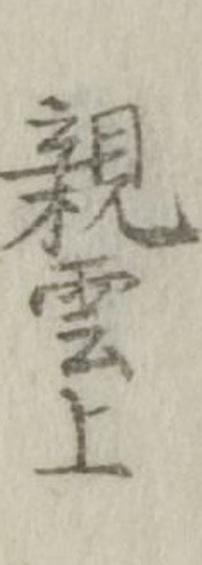比嘉親雲上
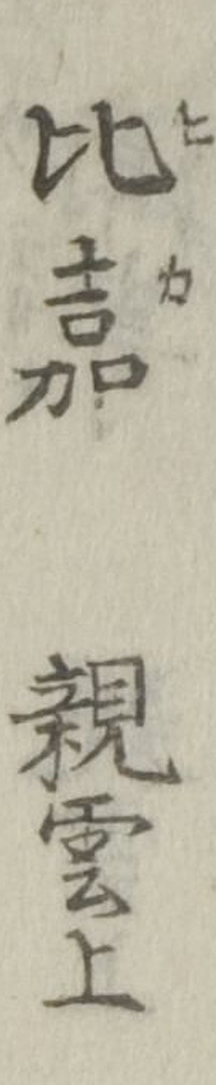比嘉親雲上
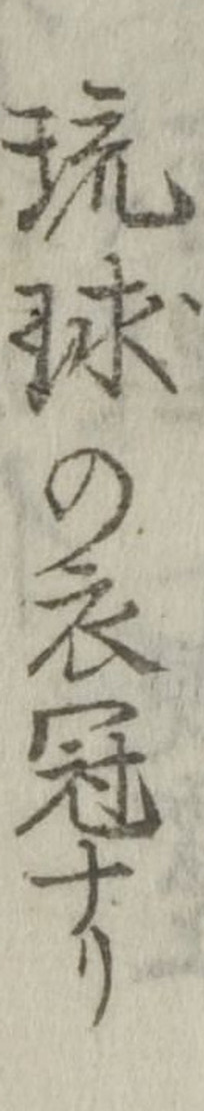琉球の衣冠ナリ
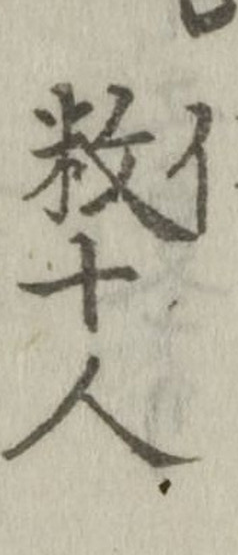数十人
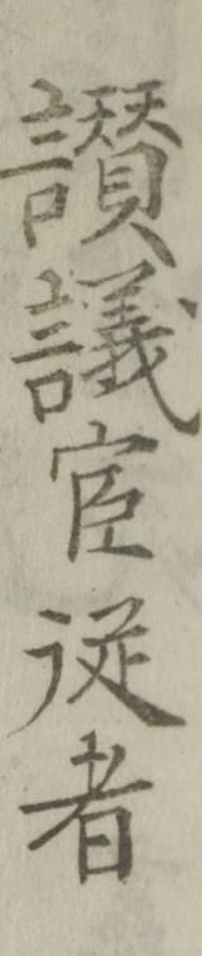讃議宦従者
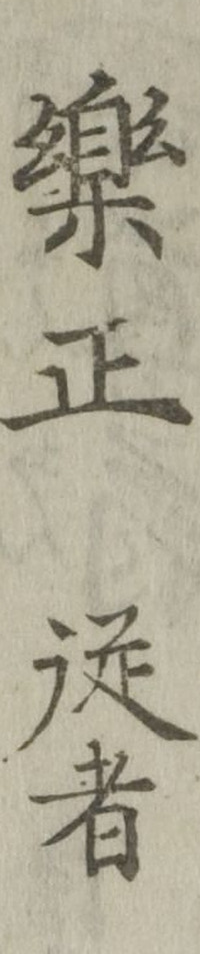樂正従者
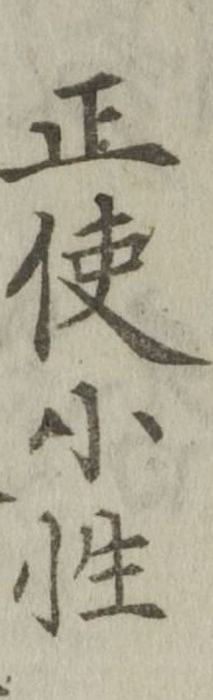正使小性
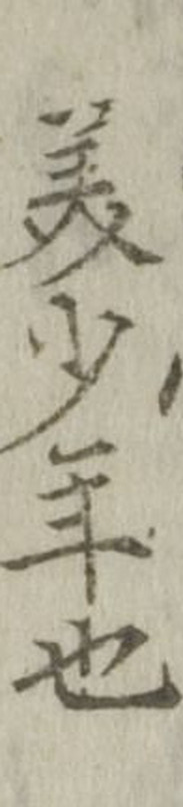美少年也
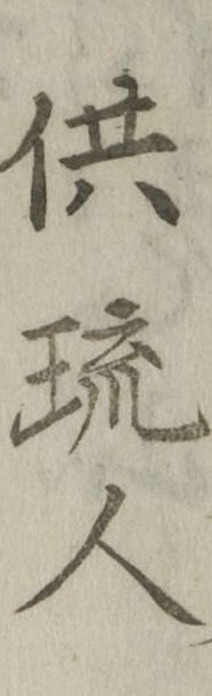供琉人
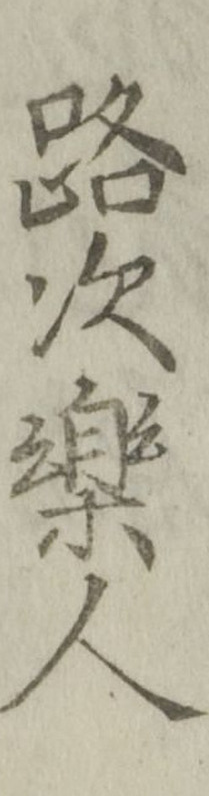路次樂人
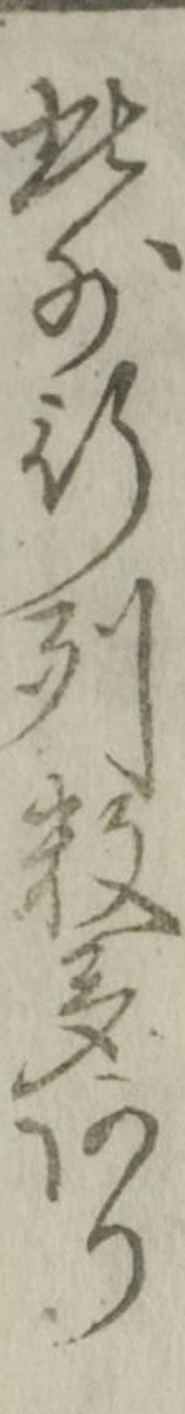此外行列数多あり
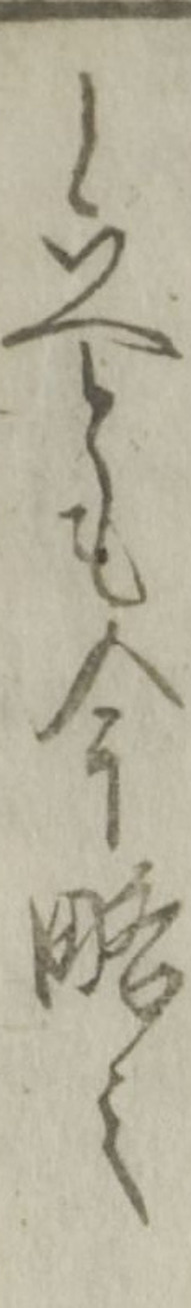といへとも今略之

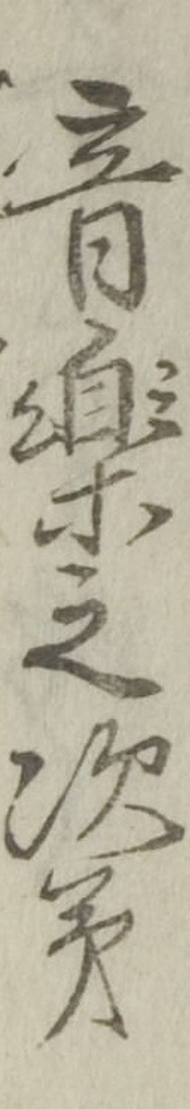音樂之次第
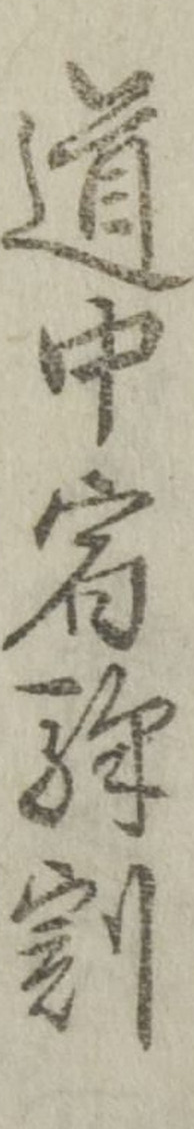道中宿驛割
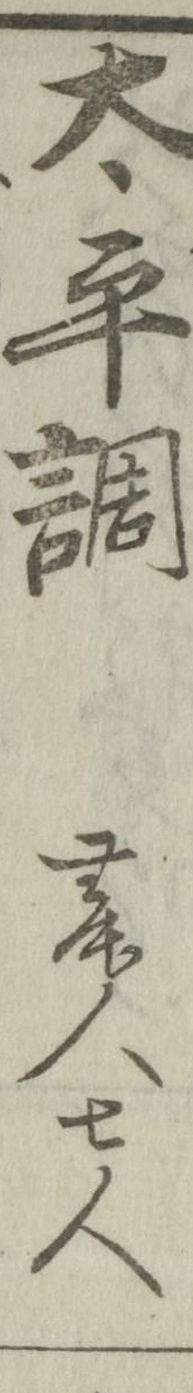大平調舞人七人
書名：琉球人行列記 天保3年
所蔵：University of the Ryukyus Library
